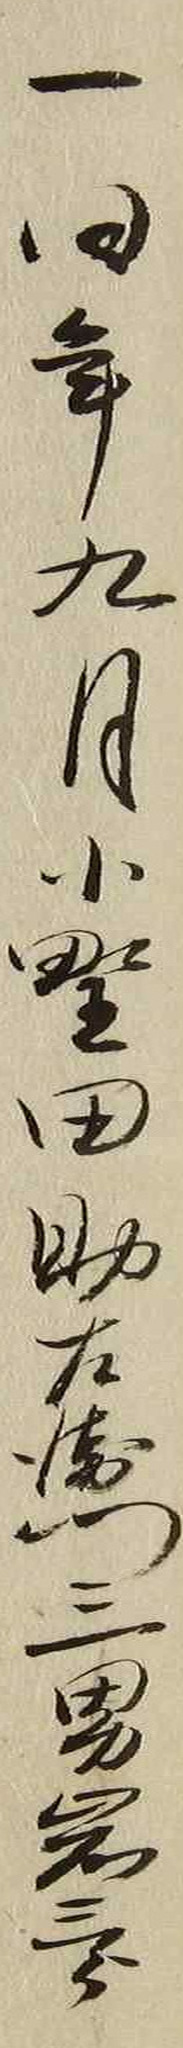一同年九月小野田助左衛門三男岩三郎
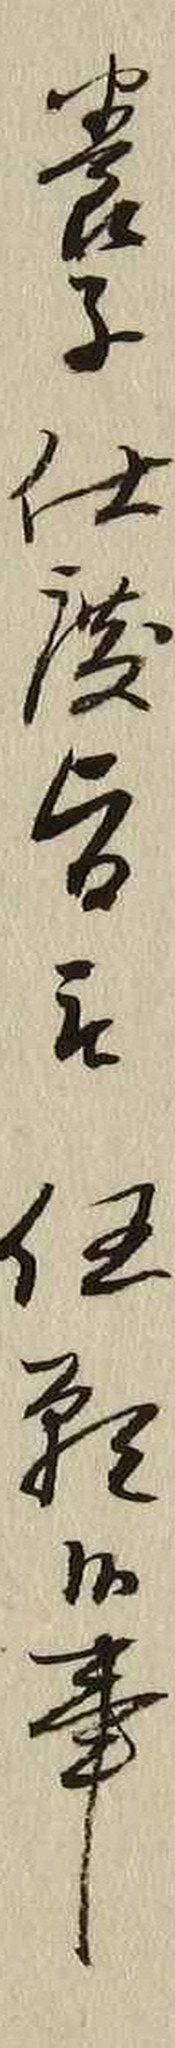養子仕度旨被任願候事
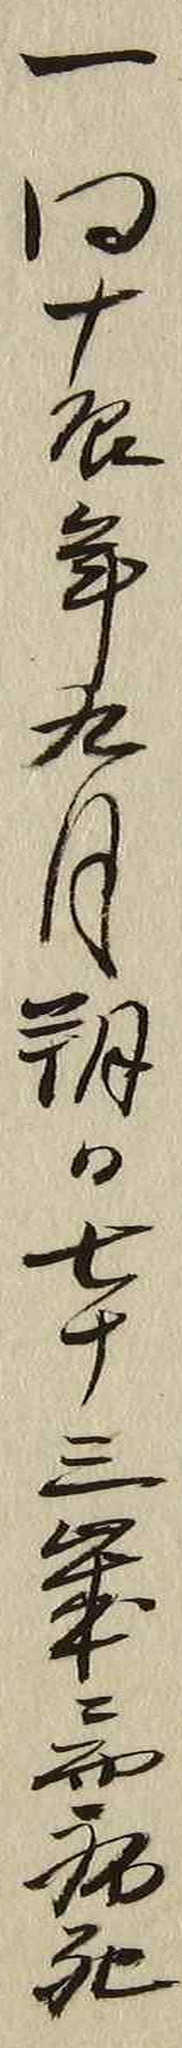一同十辰年九月朔日七十三歳ニ而病死
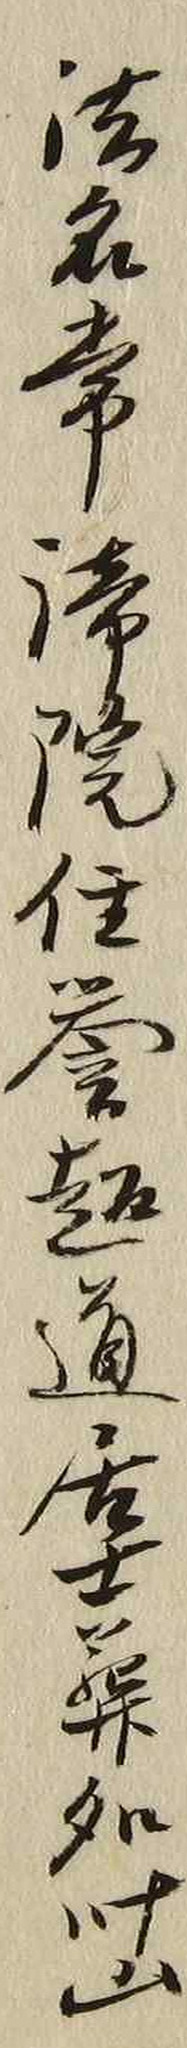法名常諦院住誉趣道居士葬処叶山
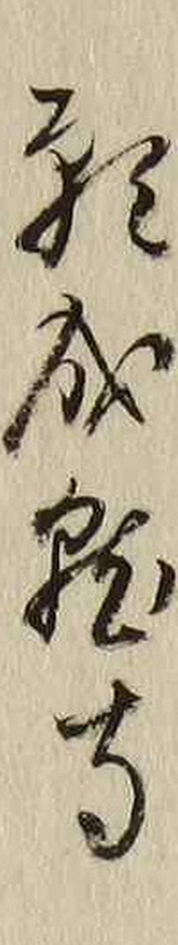願成就寺
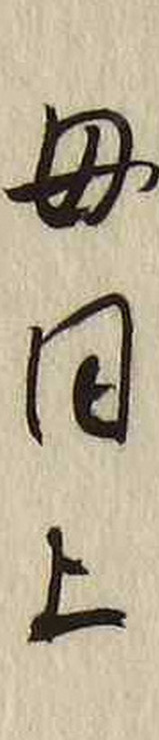母同上
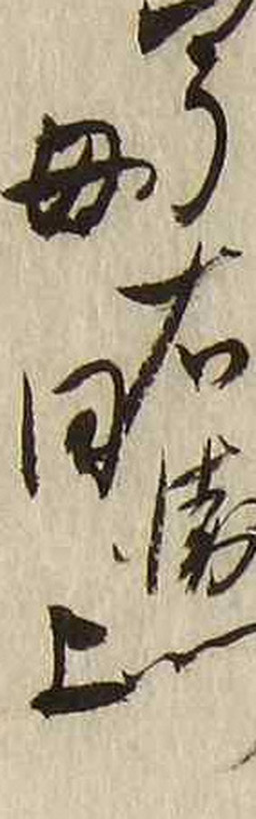母同上

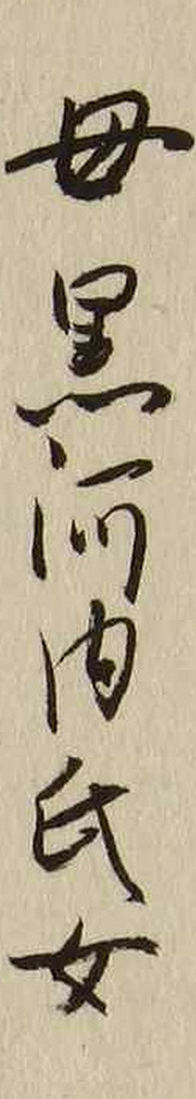母黒河内氏女
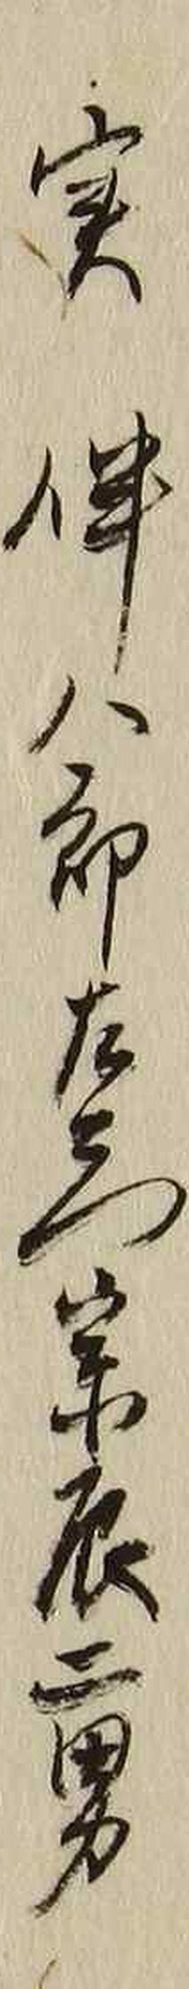実件八郎左衛門宗辰二男
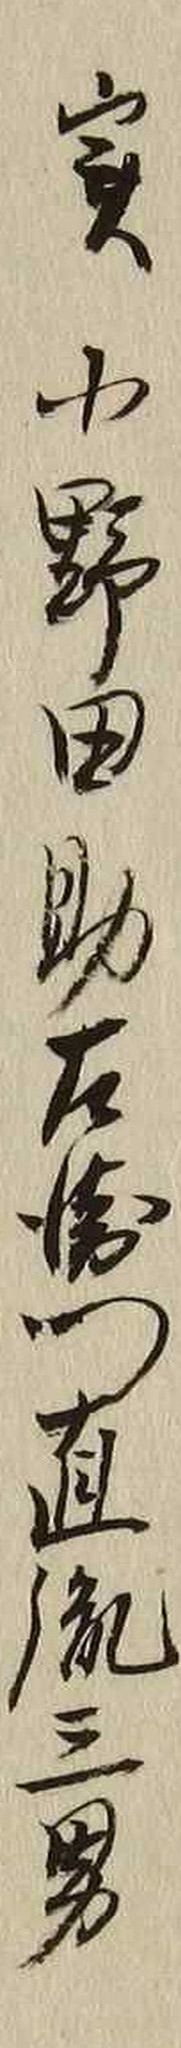実小野田助左衛門直胤三男
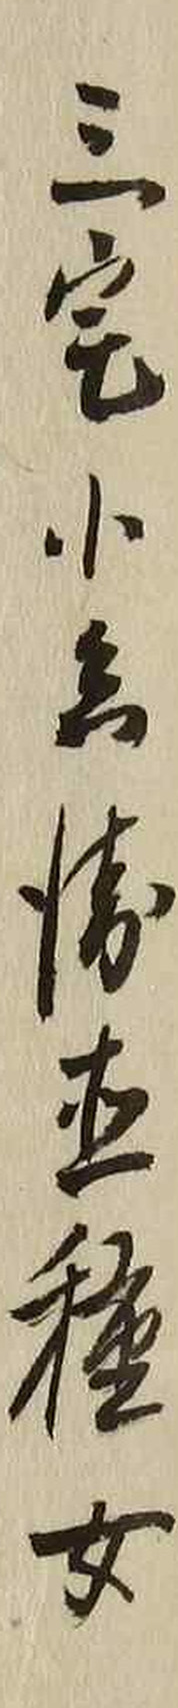三宅小兵衛直種女
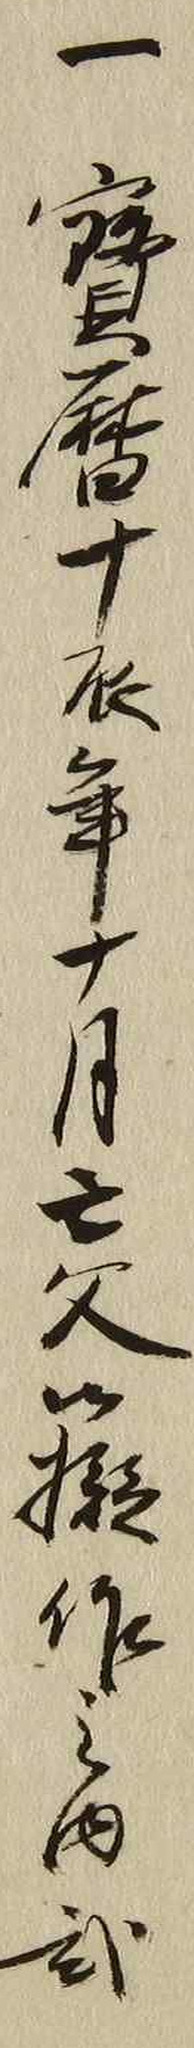一宝暦十辰年十月亡父御擬作之内弐
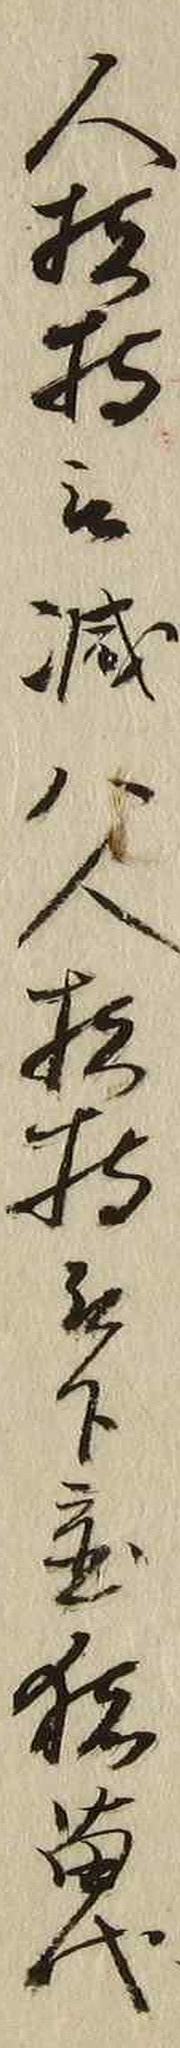人扶持被減八人扶持被下置猪苗代
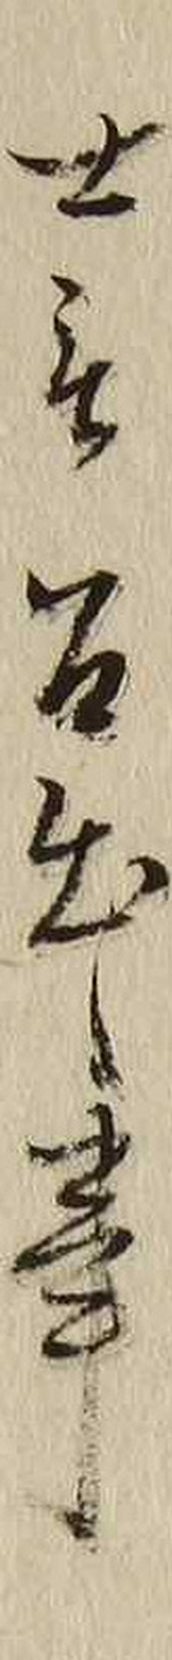士被召出候事
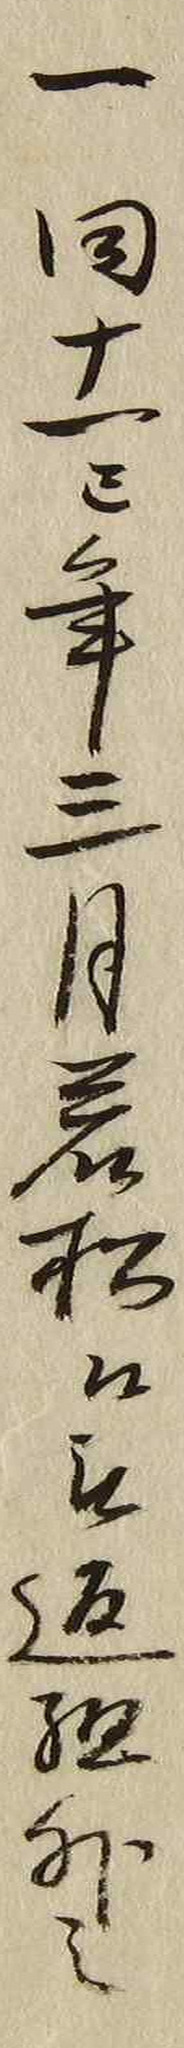一同十一巳年三月若松江被返組外之
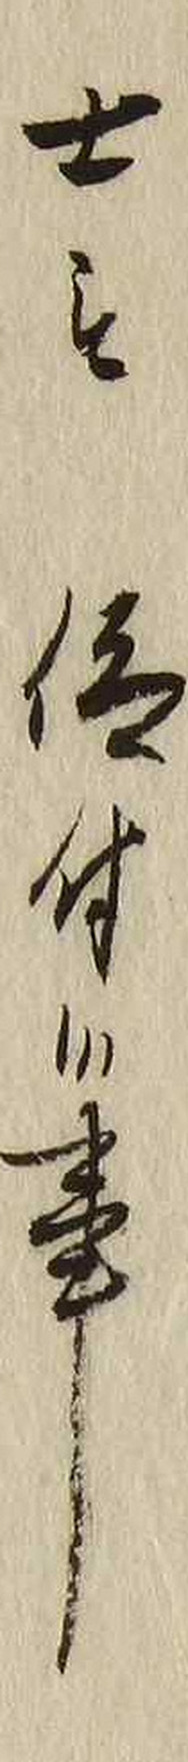士被仰付候事
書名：諸士系譜　巻之345　も之部1
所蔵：会津若松市立会津図書館
